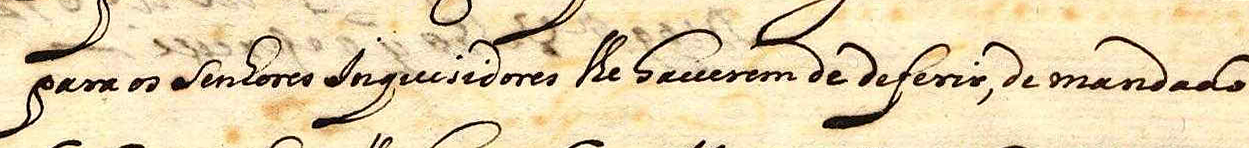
para os Senhores Inquisidores lhe hauerem de deferir, de mandado
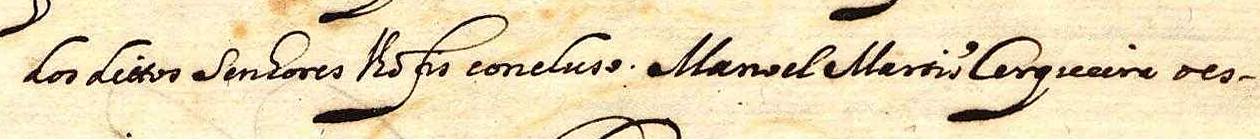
dos dittos Senhores lho fis concluso. Manoel Martis̄ Cerqueira o es
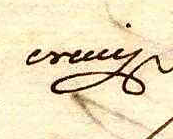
creui
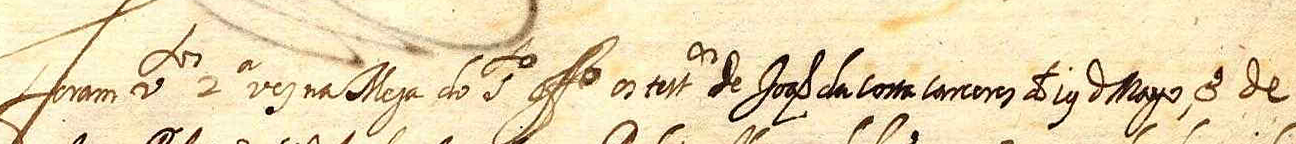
foram vtos 2.a vez na Meza do sto off.o os testos de Joaõ da costa carceres d̄ 19 d Mayo, E de
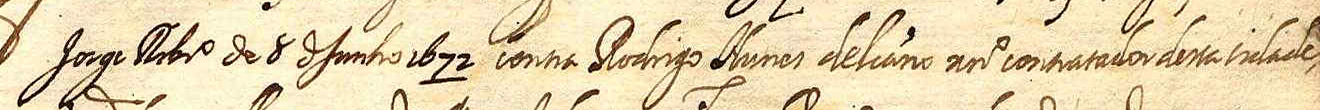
Jorge Ribro de 8 de Junho 1672 contra Rodrigo Nunes del can̄o xno contratador desta cidade,
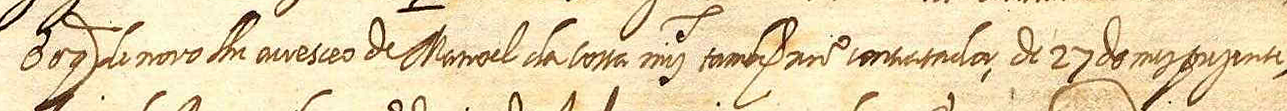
E o q̄ de novo lhe acresceo de Manoel da Costa miz̄ tambē xno contratador, de 27 do mez prezente
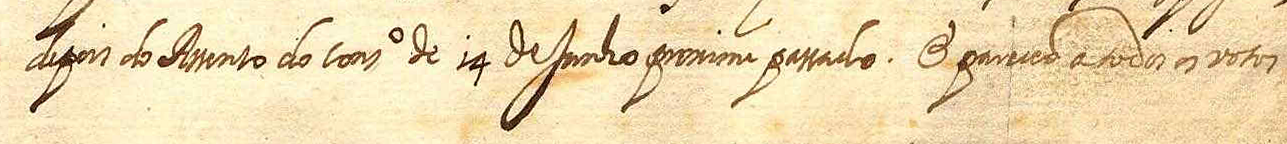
depois do Assento do Conso de 14 de Junho proxime passado. E pareceo a todos os votos
